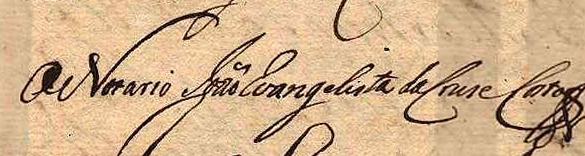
O Notario Ioaõ Evangelista da Crus e Costa
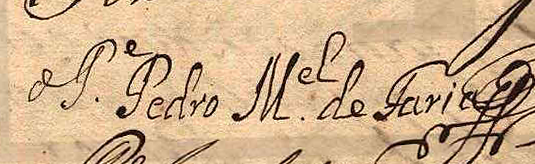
o P.e Pedro M.el de Faria
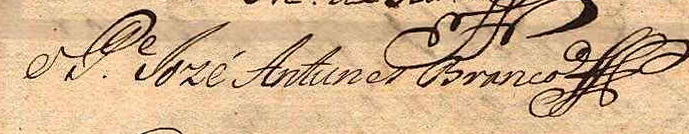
o P.e Iozé Antunes Branco
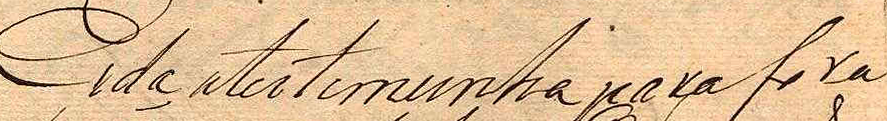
E ida a testemunha para fora
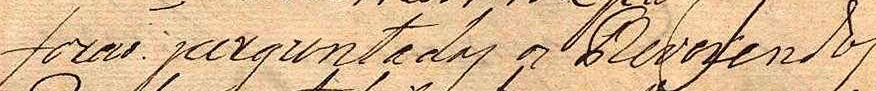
foraõ perguntadas os Reverendos
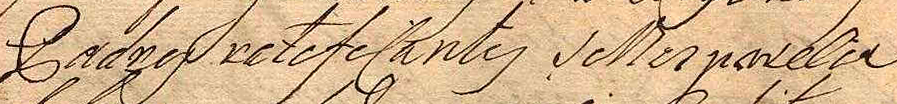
Padres ratefiCantes se lhes pareCia
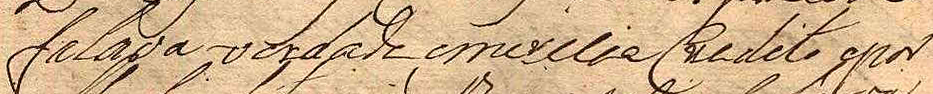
falava verdade, e merecia Credito e por
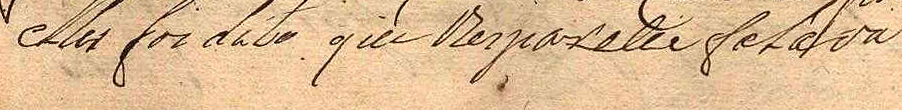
elles foi dito que lhes pareCee falava
